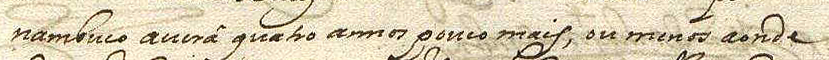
nambuco auerâ quatro annos pouco mais, ou menos aonde
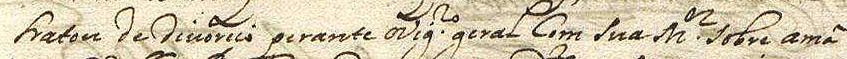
tratou de diuorcio perante o vig.ro geral Com sua M.er sobre a mâ
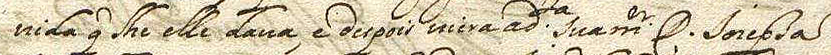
uida q̄ lhe elle daua, e despois uiera a d.a sua m.er D. Iozepha
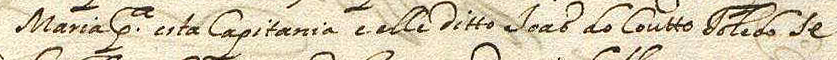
Maria p.a esta Capitania, e elle ditto Ioaõ do Coutto Toledo se
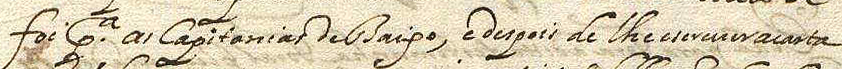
foi p.a as Capitanias de Baixo, e despois de lhe escreuer a carta
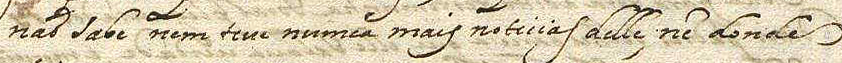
naõ sabe nem teue numca mais noticias delle, nē donde
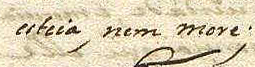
esteia, nem more;
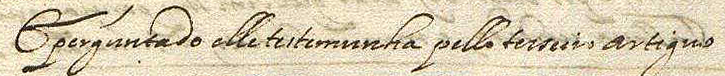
E perguntado elle testemunha pello terseiro artiguo
